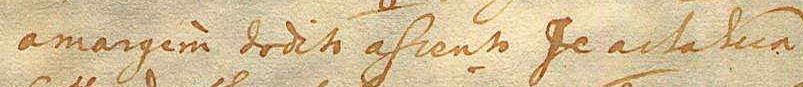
a margem do dito assento se acha huā
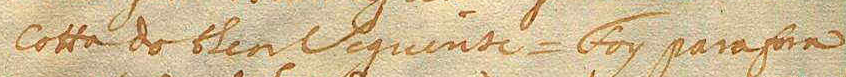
cotta do theor Seguinte = Foy para fora
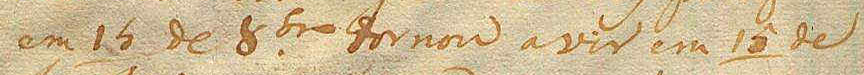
em 15 de 8.bro tornou a vir em 15 de
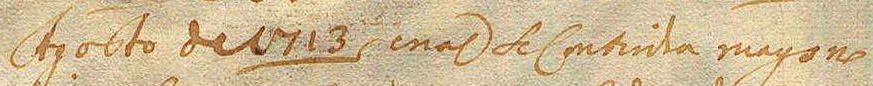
Agosto de 1713 e naꝭ se Continha mays no
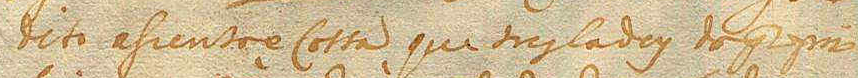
dito assento e Cotta que tresladey do proprio
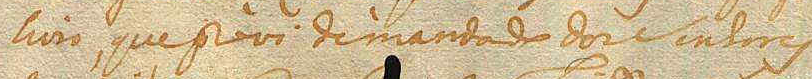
livro, que provi de mandado dos senhores
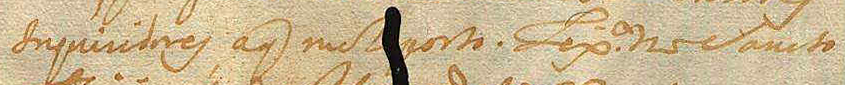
Inquisidores, a q̄ me R_porto. Lix.a no sancto
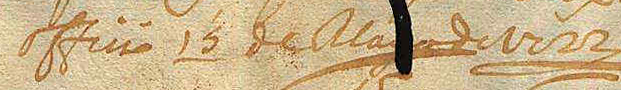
officio 15 de Mayo de 1722
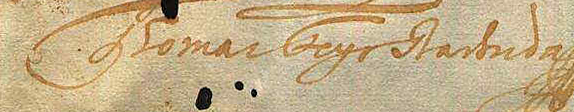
Thomas Feyo Barbuda
